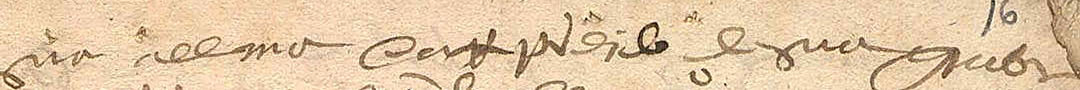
sua allma e aRepēdido de sua grave
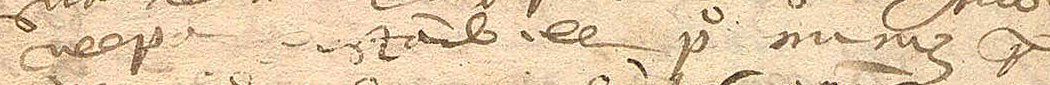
cullpa e estādo elle po nunez p̄o
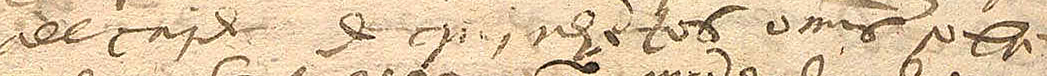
allcajde de qujnhētos omēs sobre
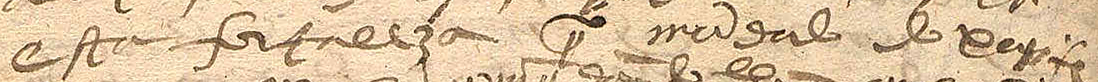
esta fortalleza p̄o mādado do xarife
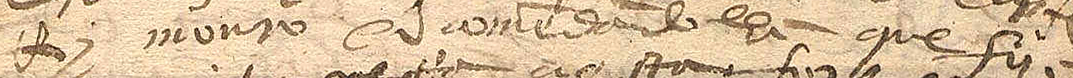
Rej mouro e ēcomēdādo lhe que fize
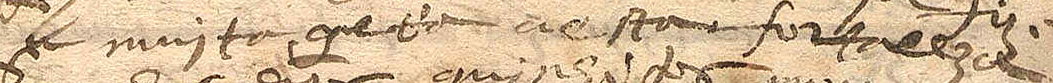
se muita gueRa a esta fortalleza
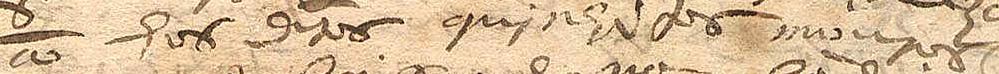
c̄o hos dītos qujnhētos mouros q̄
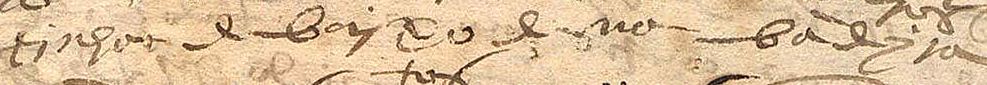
tinha debajxo de sua bādejra
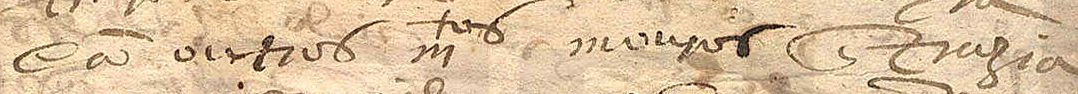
e cō outros mtos mouros q̄ trazia
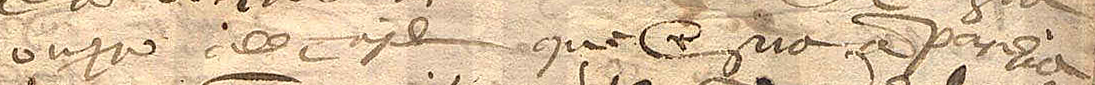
outro allcajde que ē sua c̄opanhia
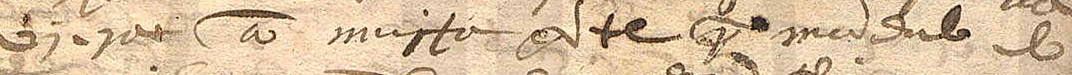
vjera c̄o mujta gēte p̄o mādado do
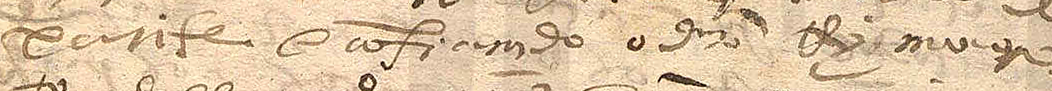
xarife e c̄ofiamdo o dit̄o Rej mouro
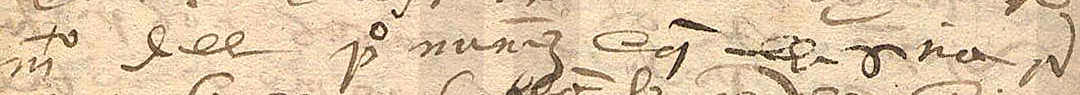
mto delle po nun̄ez e q̄ elle seria sē
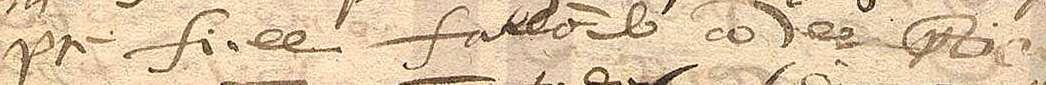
pre fiell fallādo cō elle p̄ticu
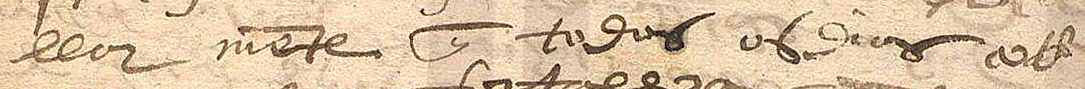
llarmēte q̄ todos os dias coRe
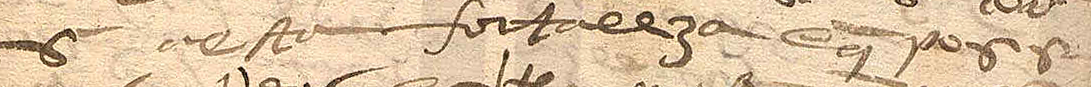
se a esta fortalleza e q̄ posese
